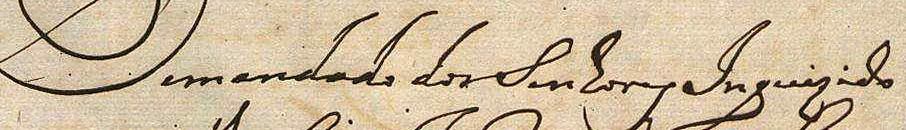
De mandado dos Senhores Inquizido
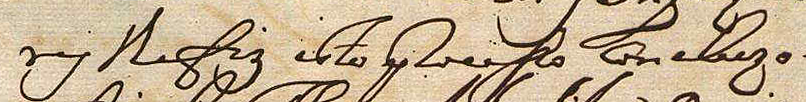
res lhe fiz este processo concluzo
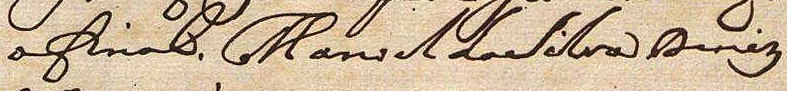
e findo. Manoel da Silva Deniz
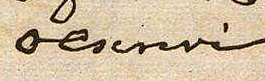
o escrevi
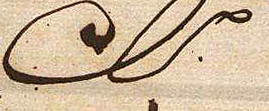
Cl.o
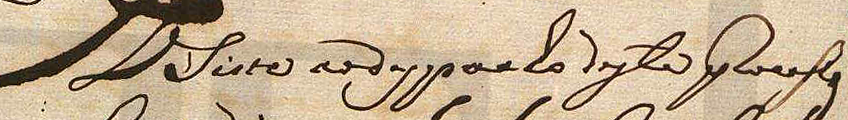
ASiste ao despacho deste processo
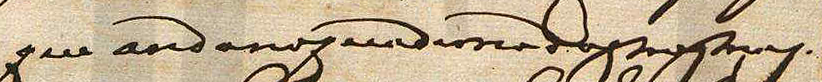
que anda no quaderno das mesmas.
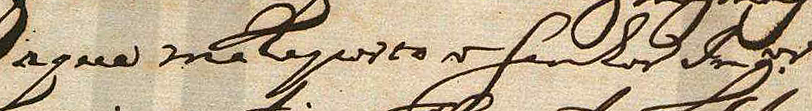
a que me Reporto o Senhor Imq.or
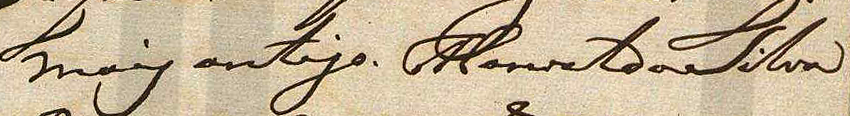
mais antigo. Manoel da Silva
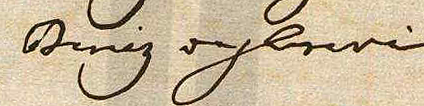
Deniz o escrevi
